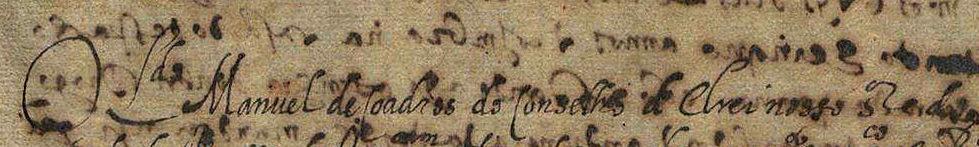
O Ldo Manuel de Coadros do Conselho del rei nosso sor e do
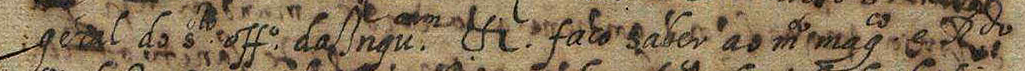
geral do sto. offo. da Inqu.çam &. faço saber ao mto mag.co e R.do
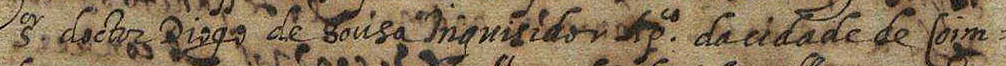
sor. doctor Diogo de Sousa Inquisidor Ap.co da cidade de Coim
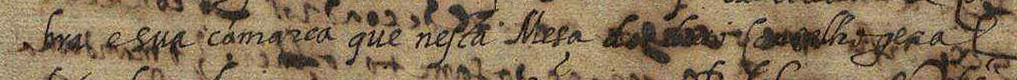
bra e sua comarca que nesta Mesa do ditto Conselho geraL
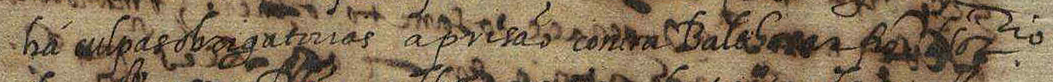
há culpas obrigatorias a prisaõ contra Balthasar frz̄ Notrio.
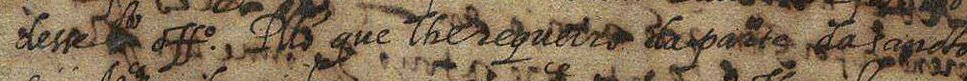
desse sto offo. Pllo que lhe requeiro da parte da sancta
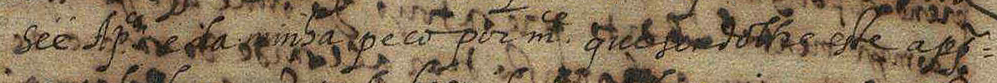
see Apca e da minha peço por mce. que sendolhe este app̄
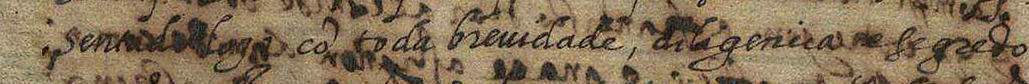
sentado logo cō toda breuidade, diligencia e segredo
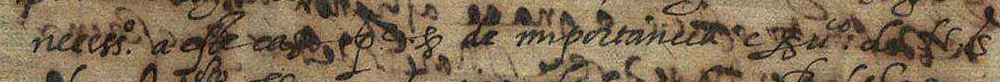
necess.o a este caso p̄o ꞩ de importancia e ꞩuço. de N. Sor
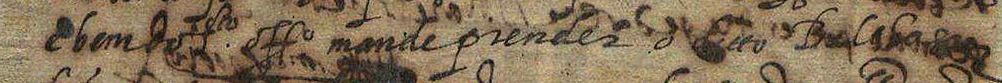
e bem do sto. offo mande prender o ditto Balthasar
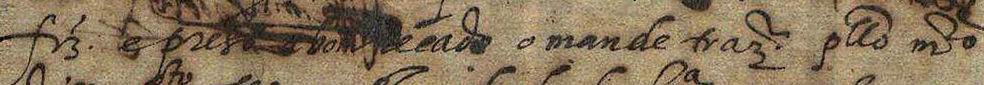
frz̄ e preso a bom Recado o mande traz̄ pl̄lo mro
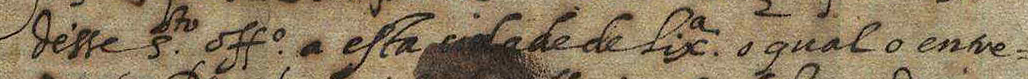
desse s.to offo. a esta cidade de Lixa. o qual o entre
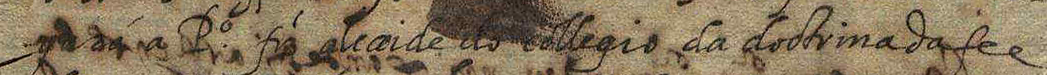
gará a Po. frz̄ alcaide do collegio da doctrina da fee
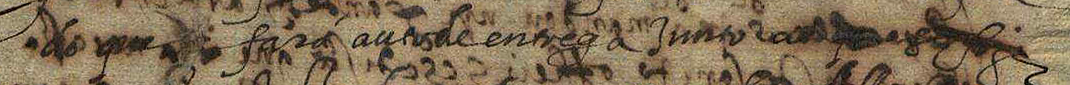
do que _ fará auto de entrega Iunto ao p_eso f_zer
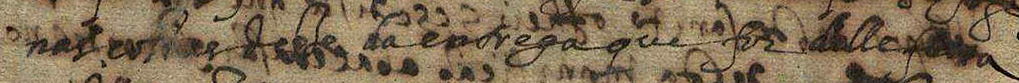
nas costas deste da entrega que fiz delle f_a
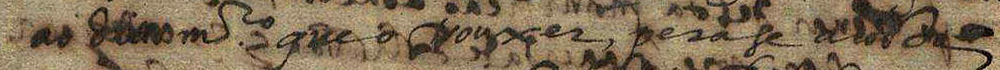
ao ditto m.ro que o trouxer, pera se acostar
